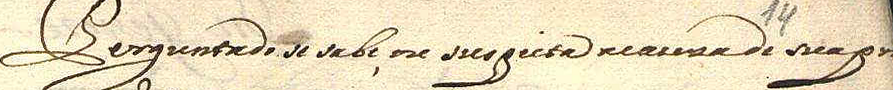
Perguntado se sabe, ou suspeita a cauza de sua pri
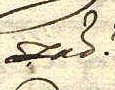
zaõ?
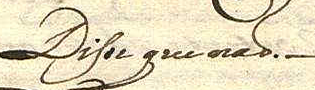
Disse que naõ. ‒
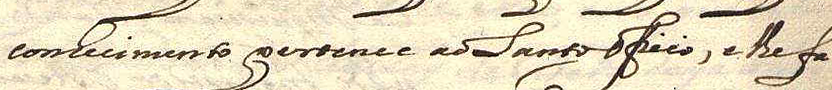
conhecimento pertence ao Santo officio, e lhe fa
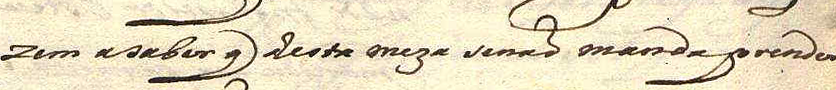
zem a saber q̄ desta meza se naõ manda prender
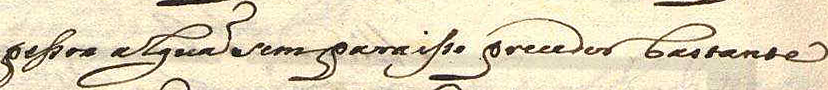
pessoa alguā sem para isso preceder bastante
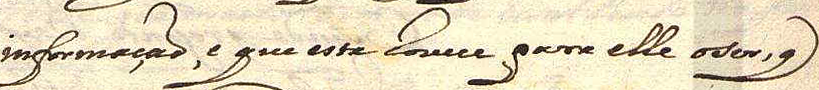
informaçaõ, e que esta houue para elle o ser, q̄
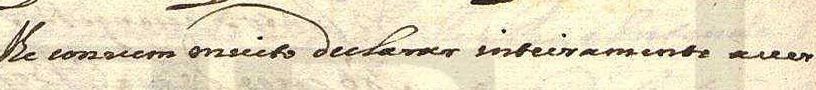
lhe conuem muito declarar inteiramente a uer
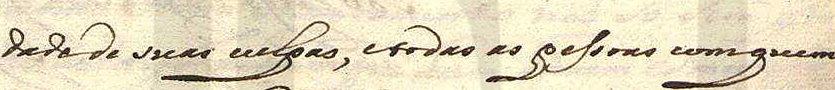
dade de suas culpas, e todas as pessoas com quem
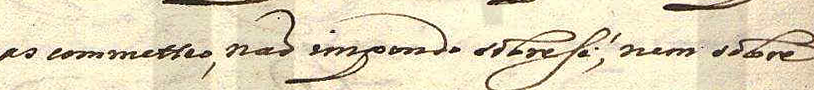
as commetteo, naõ impondo sobre si; nem sobre
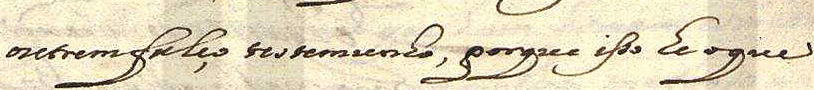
outrem falço testemunho, porque isso he o que
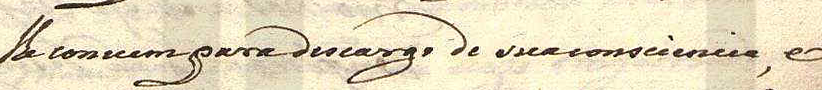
lhe conuem para descargo de sua consciencia, e
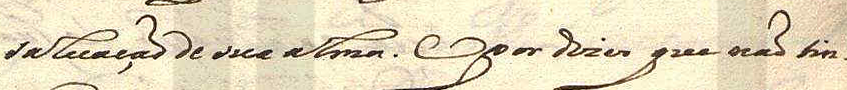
saluaçaõ de sua alma. e por dizer que naõ tin
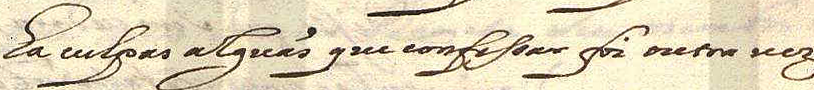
ha culpas alguas̄ que confessar foi outra uez
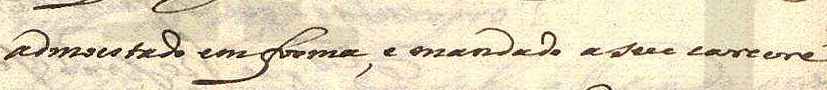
admoestado em forma, e mandado a seu carcere
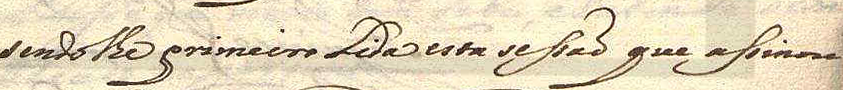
sendolhe primeiro lida esta sessaõ que assinou
